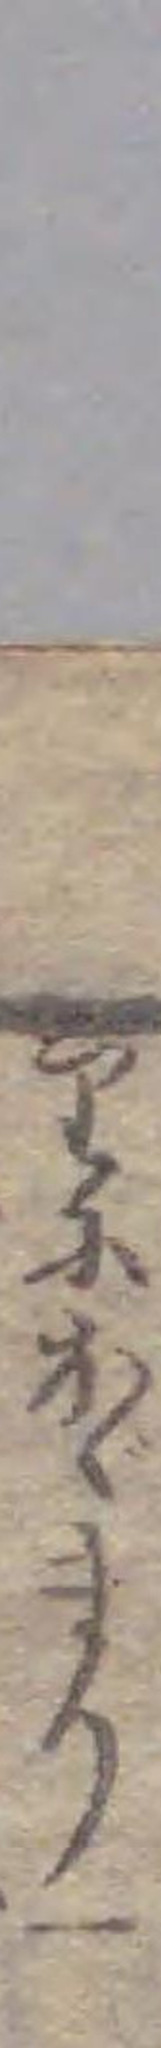りにかゞまり一
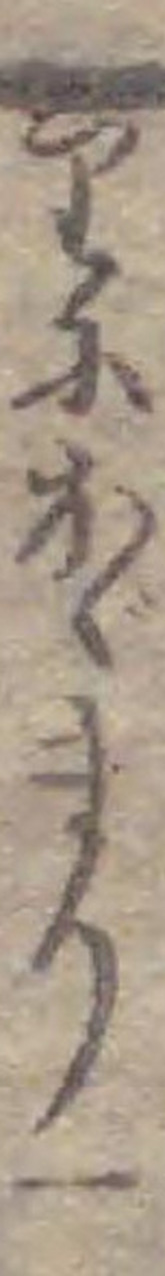りにかゞまり一
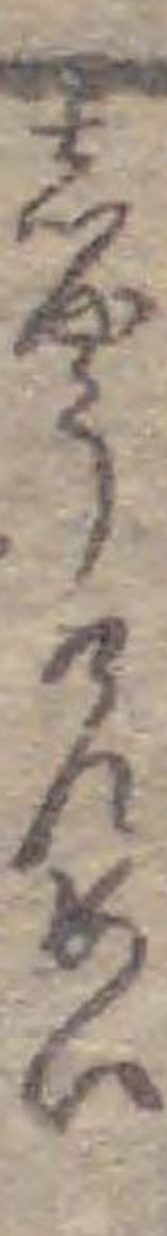しやうけんめい
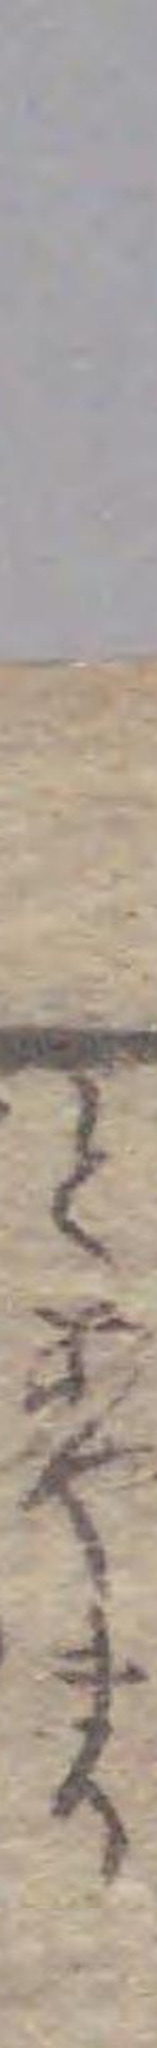とあやまり
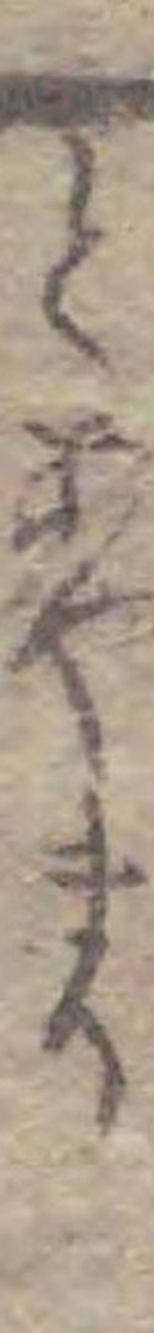とあやまり
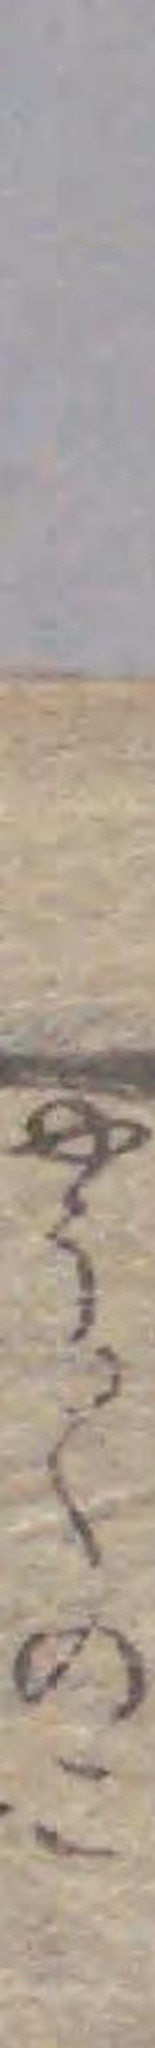やう〳〵のこ
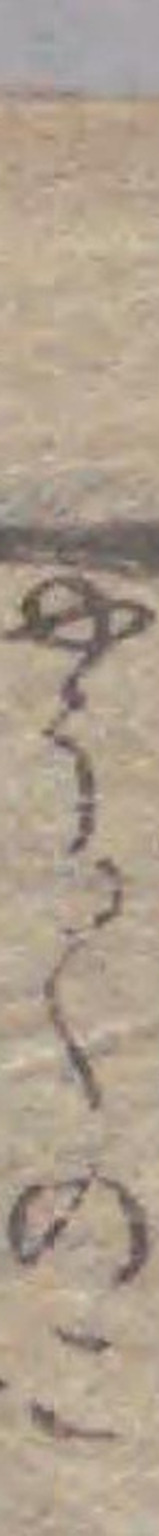やう〳〵のこ
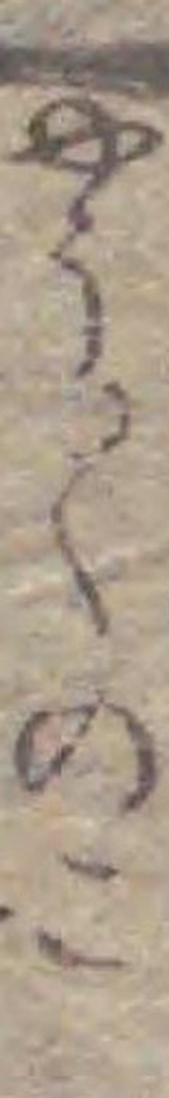やう〳〵のこ
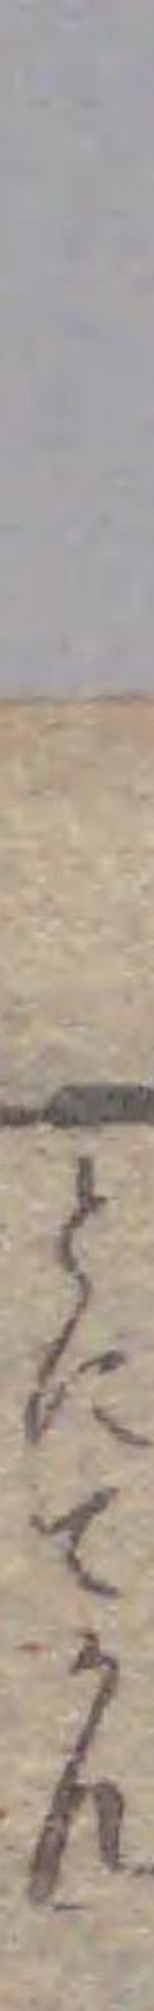とにてかん
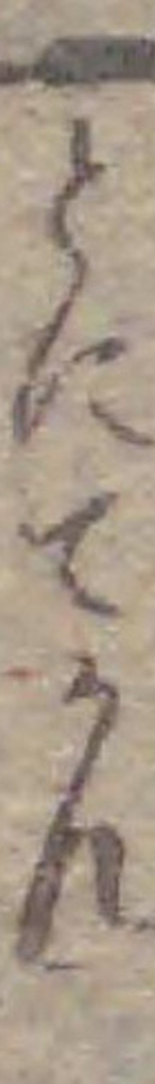とにてかん
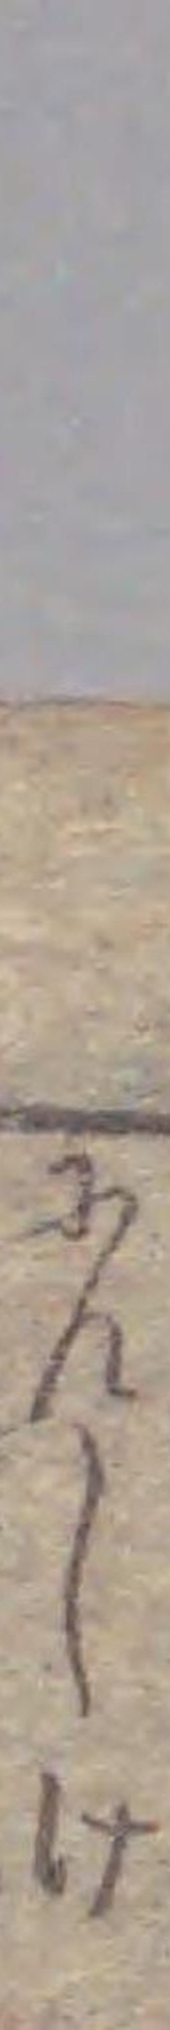にんしけ
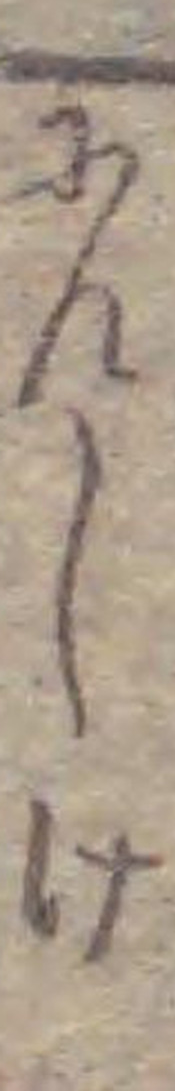にんしけ
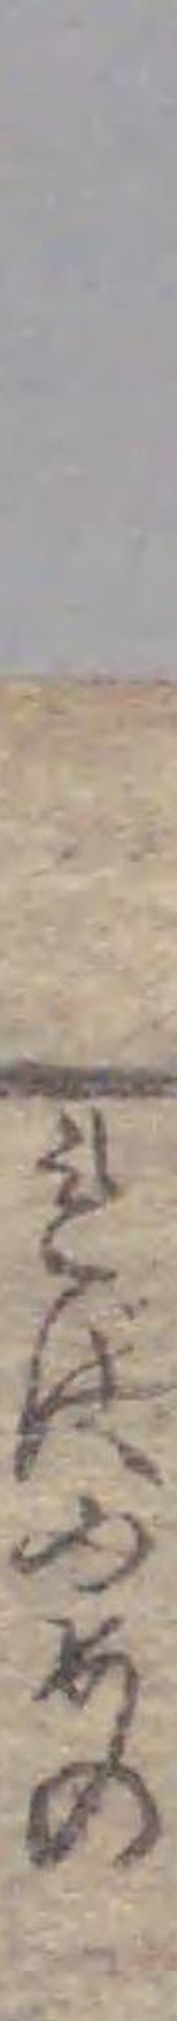ればゆめの
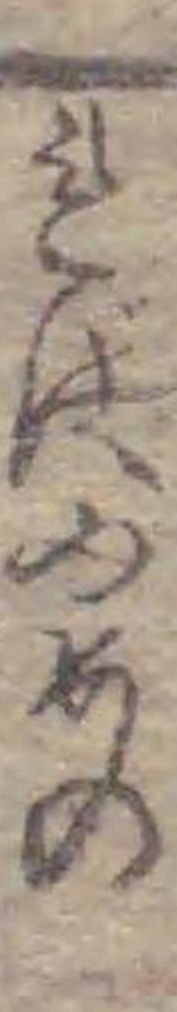ればゆめの
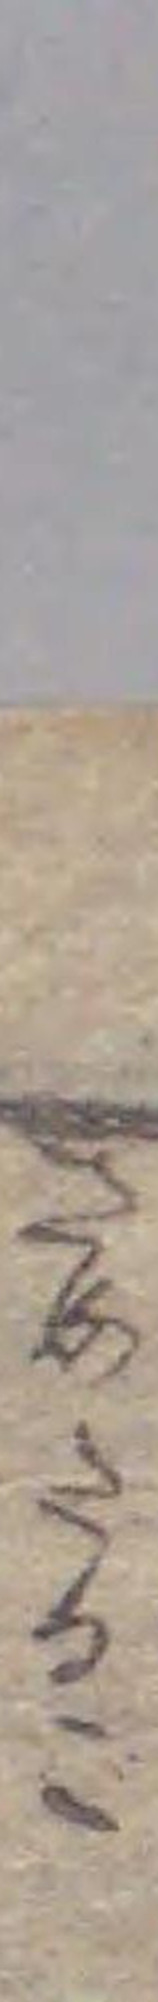さめたるご
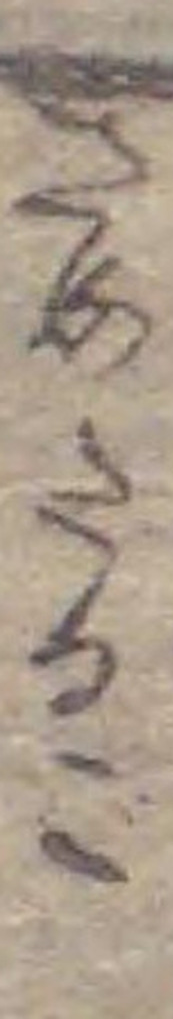さめたるご
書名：紺屋百物語 : 3巻
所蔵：国立国会図書館 National Diet Library, JAPAN
